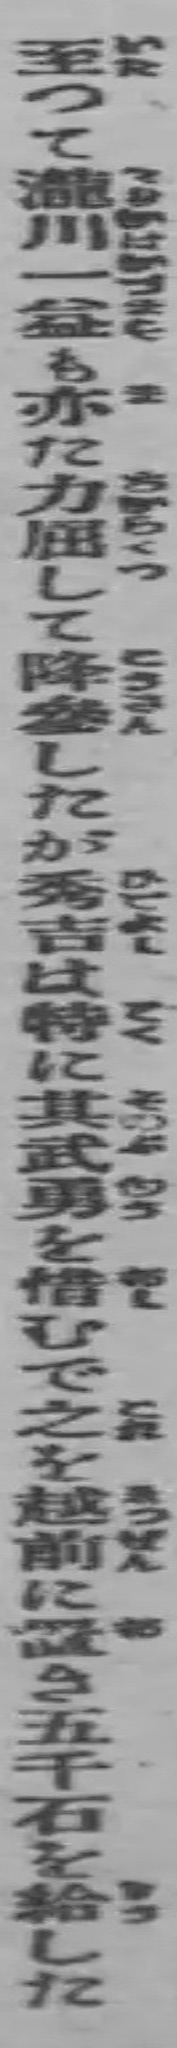至つて瀧川一益も亦た力屈して降参したが秀吉は特に其武勇を惜むで之を越前に置き五千石を給した
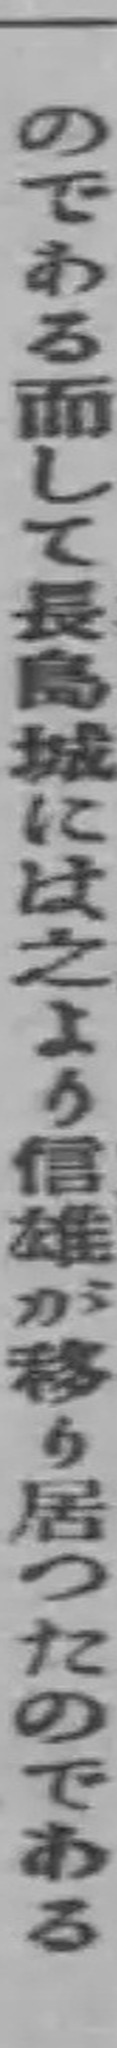のである而して長島城には之より信雄が移り居つたのである
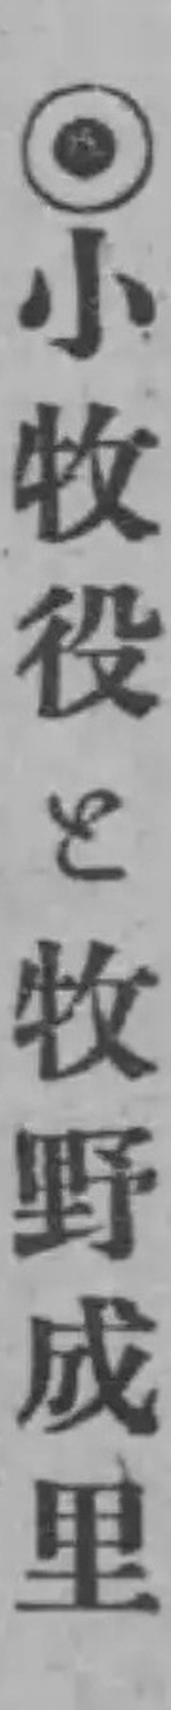⦿小牧役と牧野成里
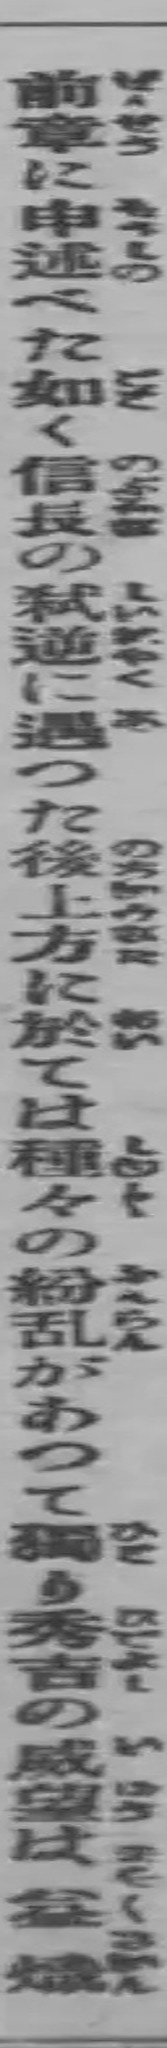前章に申述べた如く信長の弑逆に遇つた後上方に於ては種々の紛乱があつて独り秀吉の威忘は益熾
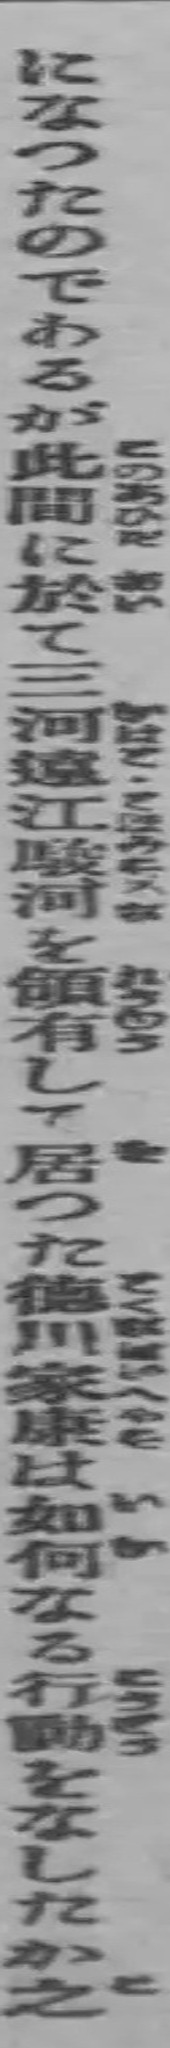になつたのであるが此間に於て三河遠江駿河を領有して居つた徳川家康は如何なる行動をなしたか之
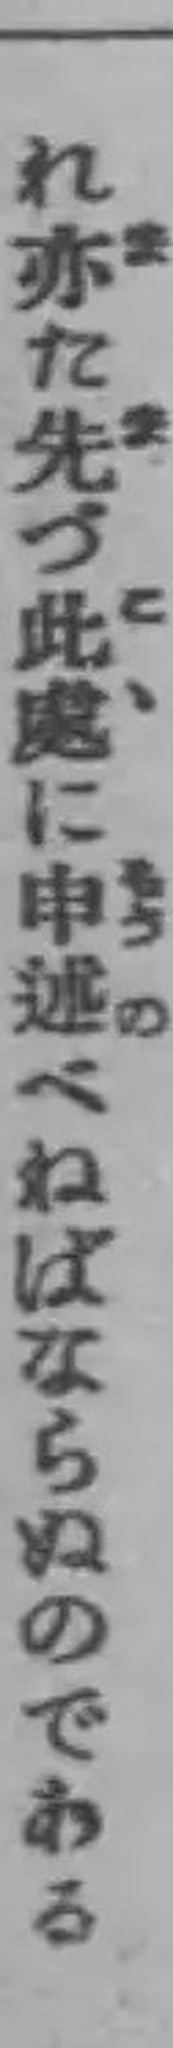れ亦た先づ此処に申述べねばならぬのである

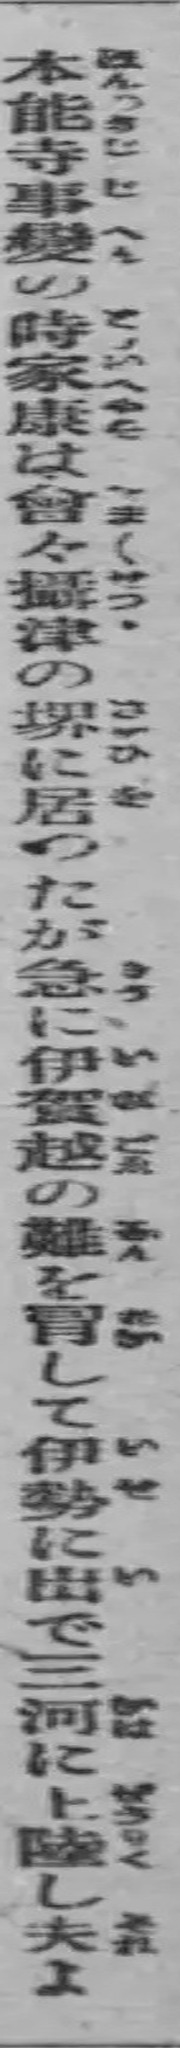本能寺事変の時家康は会々摂津の堺に居つたが急に伊賀越の難を冒して伊勢に出で三河に上陸し夫よ
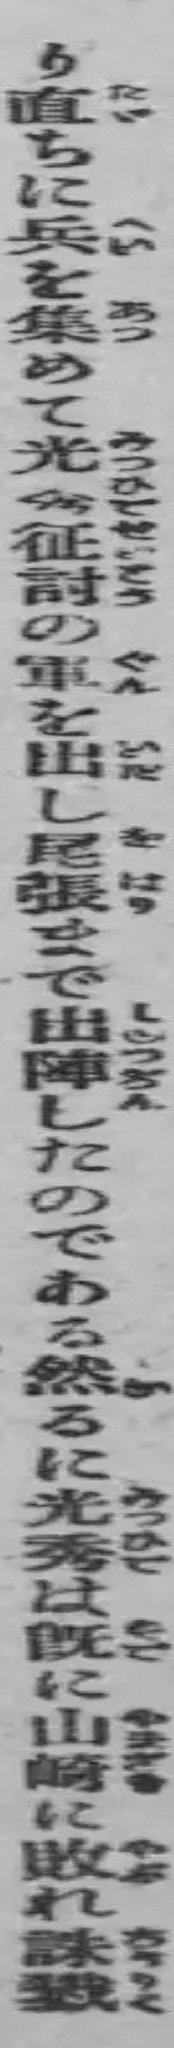り直ちに兵を集めて光秀征討の軍を出し尾張まで出陣したのである然るに光秀は既に山崎に敗れ誅戮
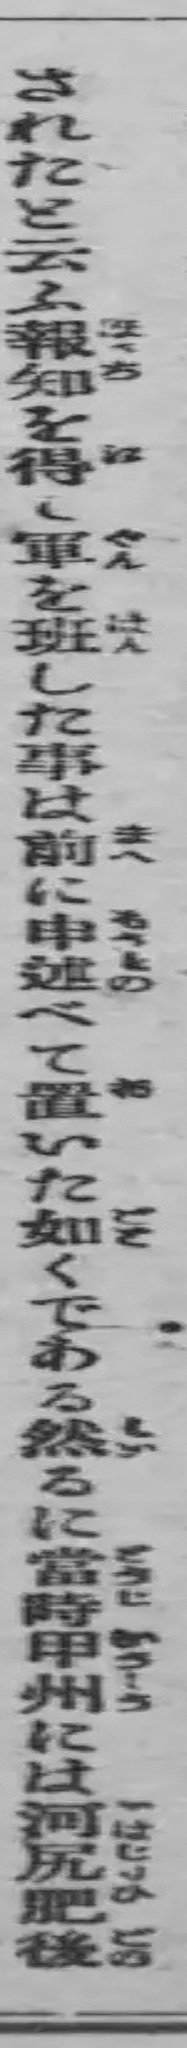されたと云ふ報知を得て軍を班した事は前に申述べて置いた如くである然るに当時甲州には河尻肥後
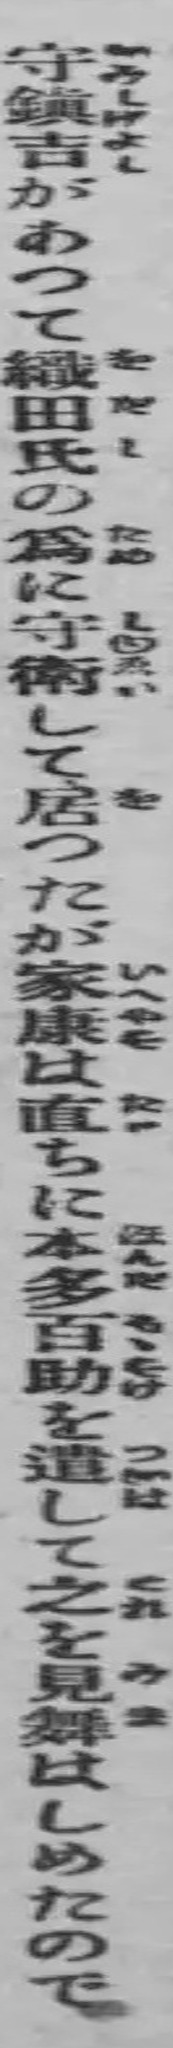守鎮吉があつて織田氏の為に守衛して居つたが家康は直ちに本多百助を遣して之を見舞はしめたので
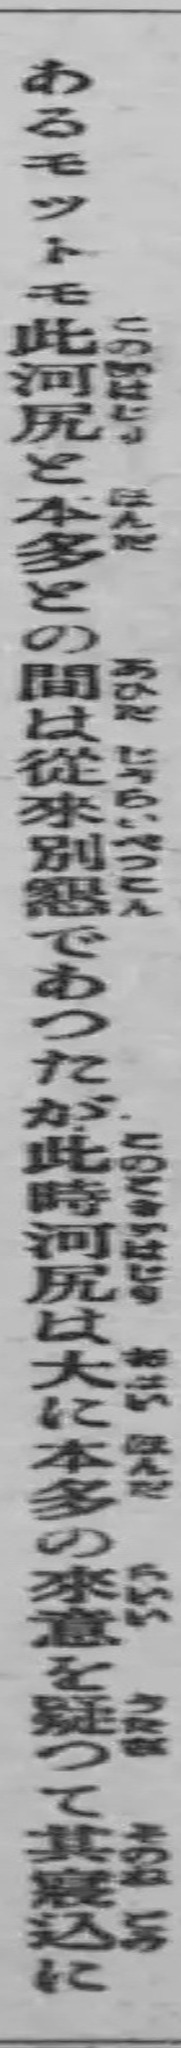あるモツトモ此河尻と本多との間は従来別懇であつたが此時河尻は大に本多の来意を疑つて其寝込に
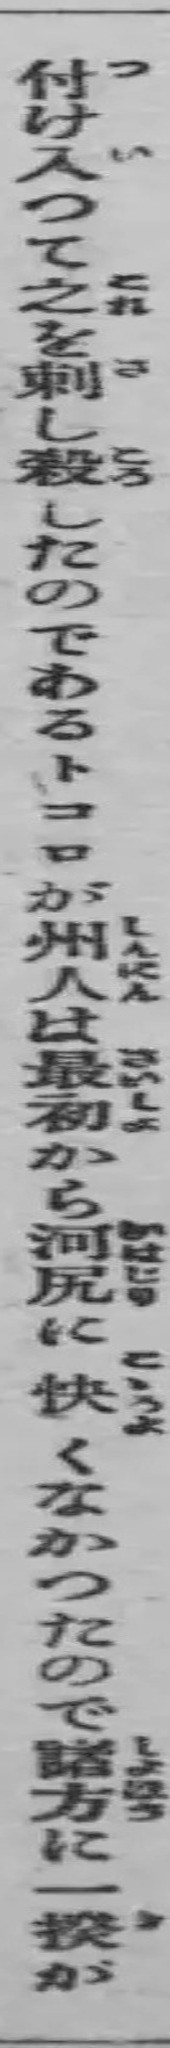付け入つて之を刺し殺したのであるトコロが州人は最初から河尻に快くなかつたので諸方に一揆が
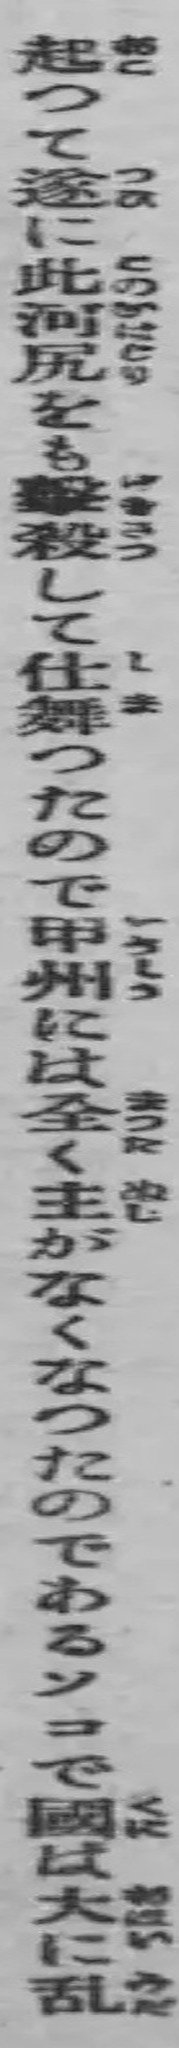起つて遂に此河尻をも撃殺して仕舞つたので甲州には全く主がなくなつたのであるソコで国は大に乱
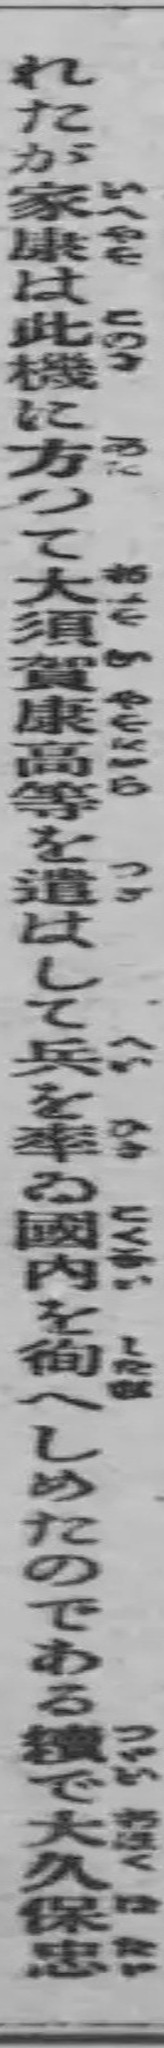れたが家康は此機に方つて大須賀康高等を遣はして兵を率ゐ国内を徇へしめたのである続で大久保忠
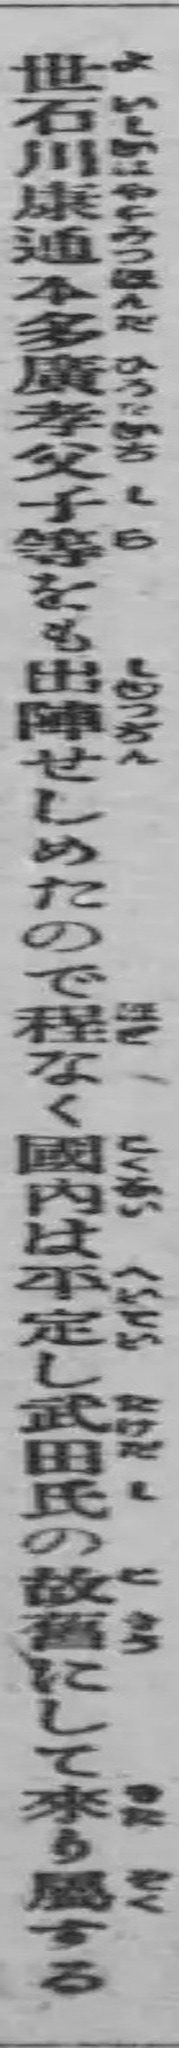世石川康通本多広孝父子等をも出陣せしめたので程なく国内は平定し武田氏の故旧にして来り属する
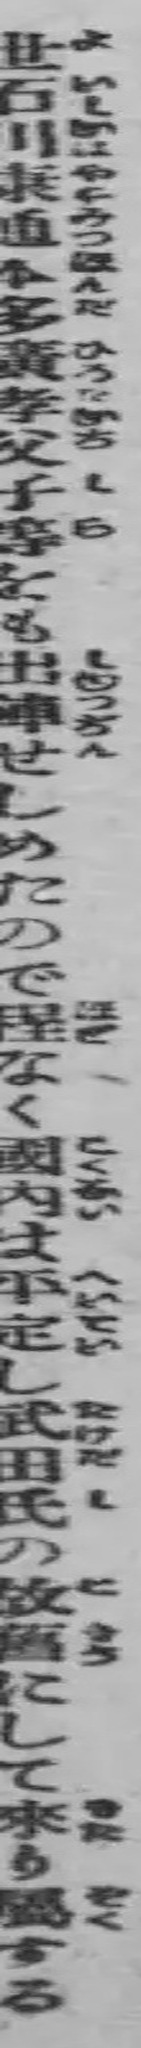世石川康通本多広孝父子等をも出陣せしめたので程なく国内は平定し武田氏の故旧にして来り属する
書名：豊橋市史談
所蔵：国立国会図書館 National Diet Library, JAPAN
